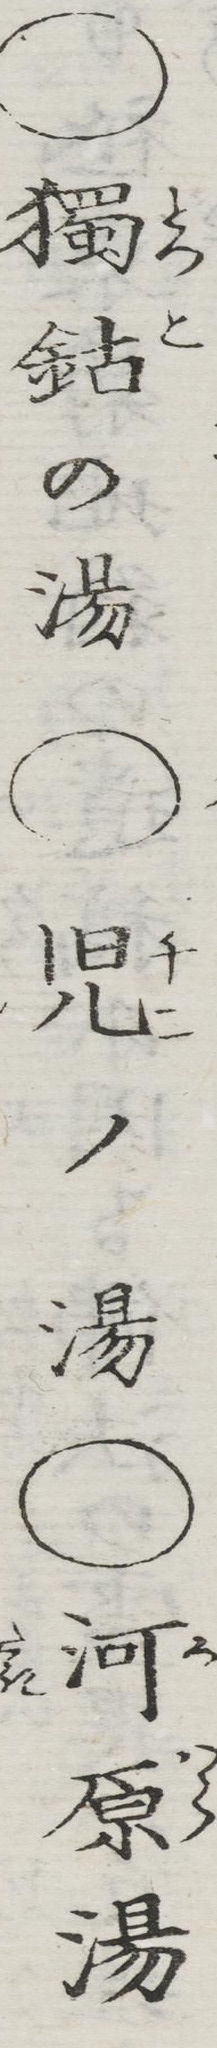○独鈷の湯○児ノ湯○河原湯
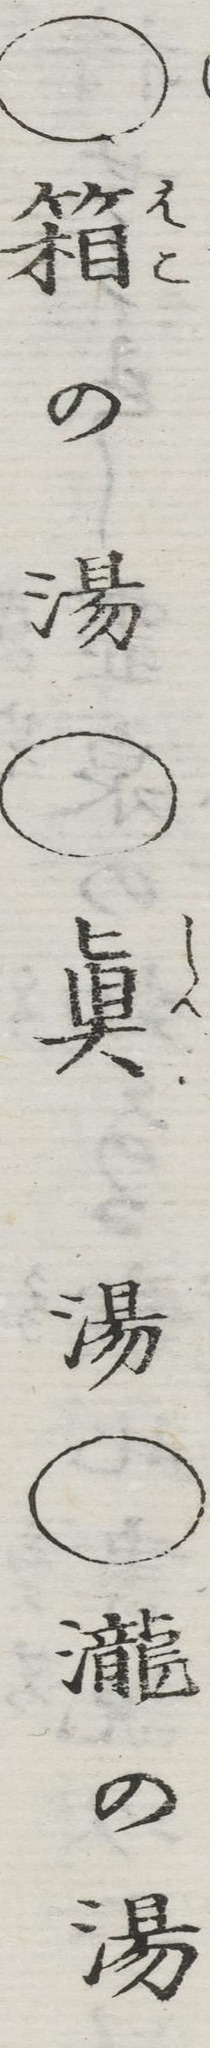○箱の湯○真湯○滝の湯
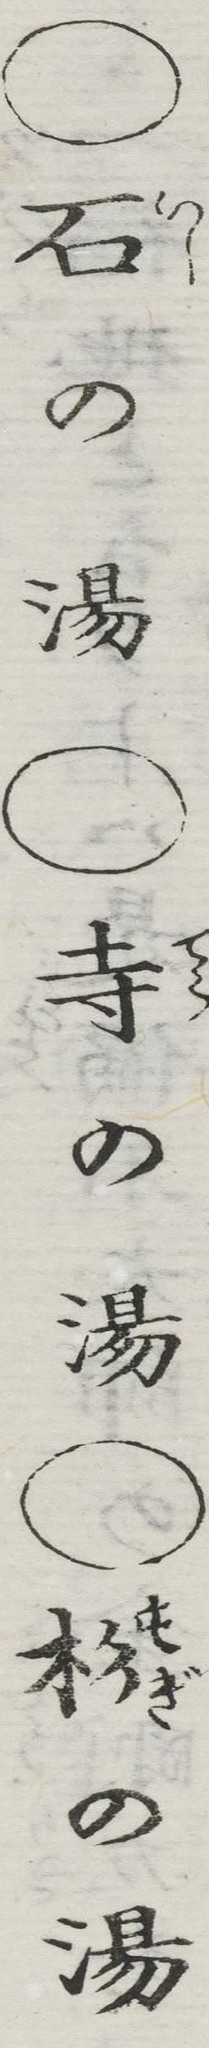○石の湯○寺の湯○杉の湯
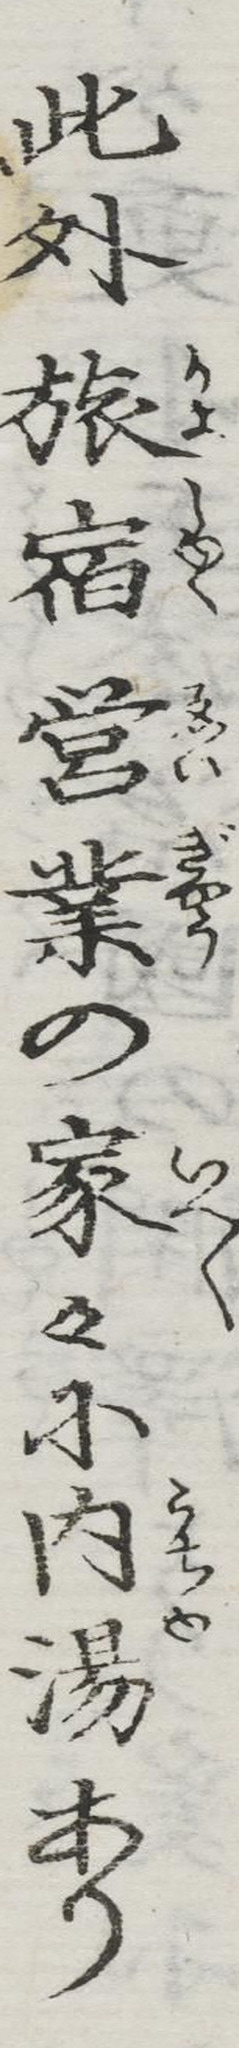此外旅宿営業の家々に内湯あり
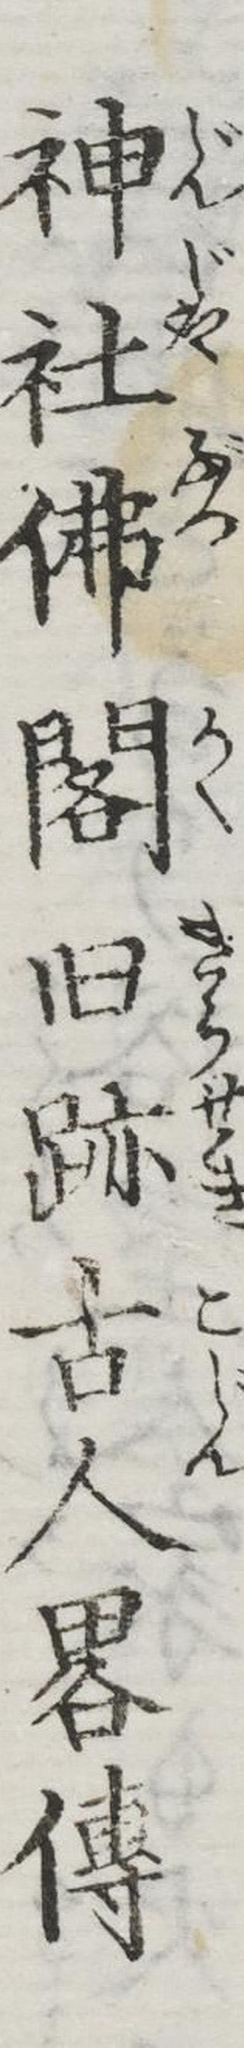神社仏閣旧跡古人略伝
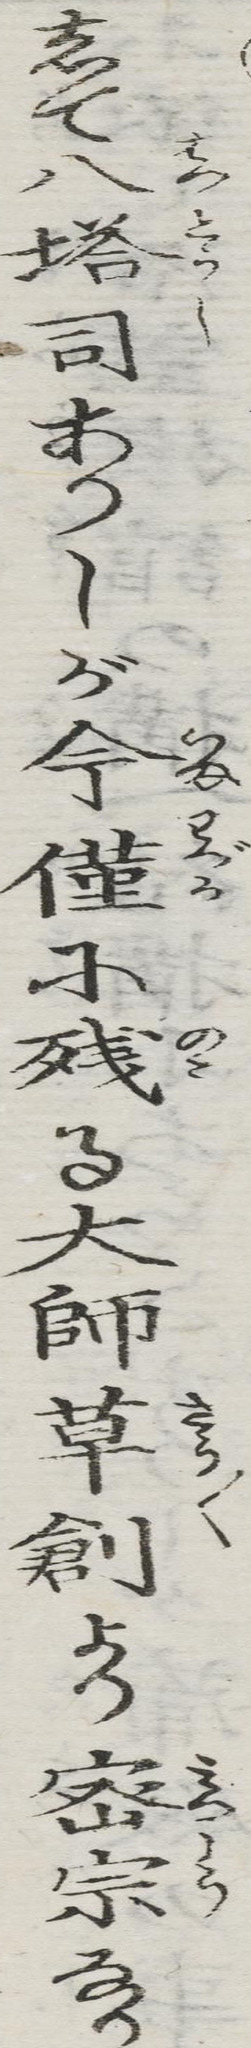して八塔司ありしが今僅に残る大師草創より密宗なり
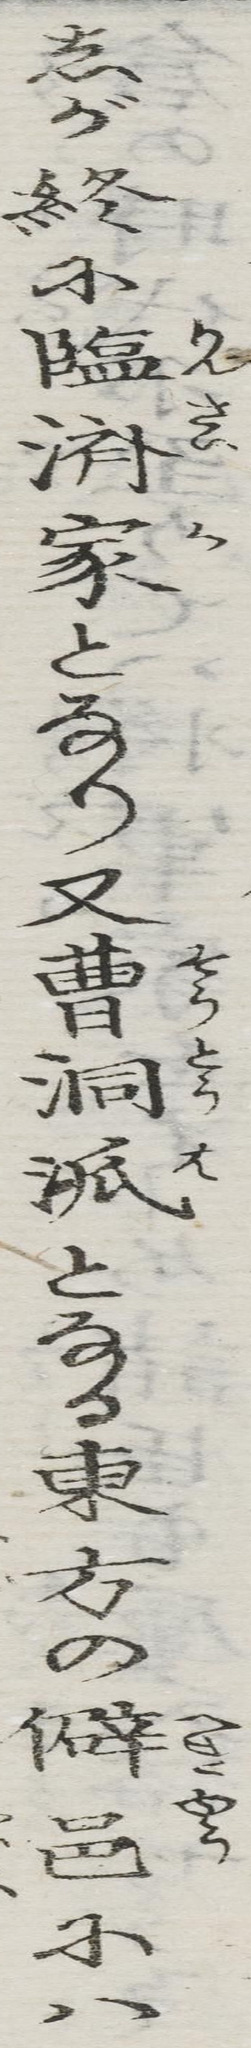しが終に臨済家となり又曹洞派となる東方の僻邑には
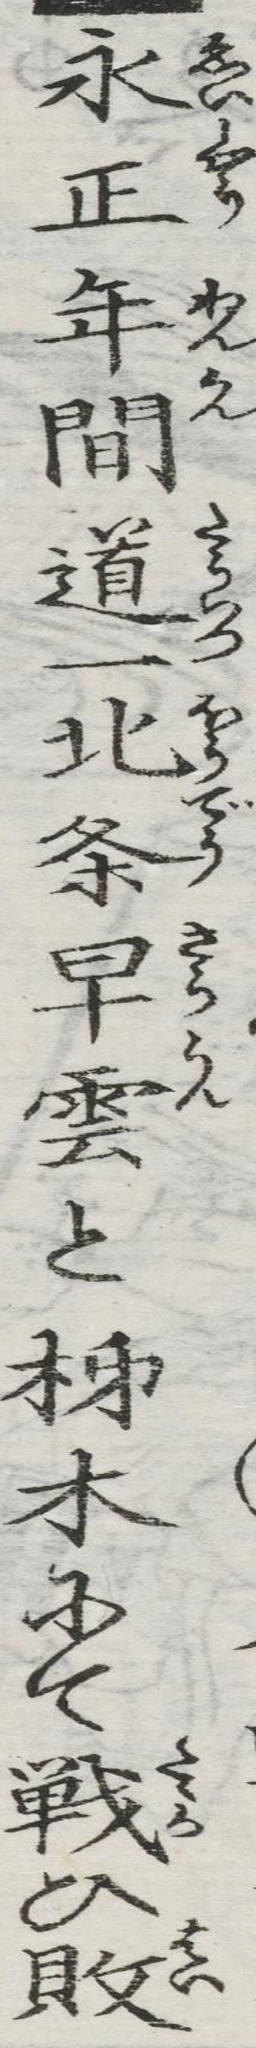の墓永正年間道一北条早雲と柿木にて戦ひ敗
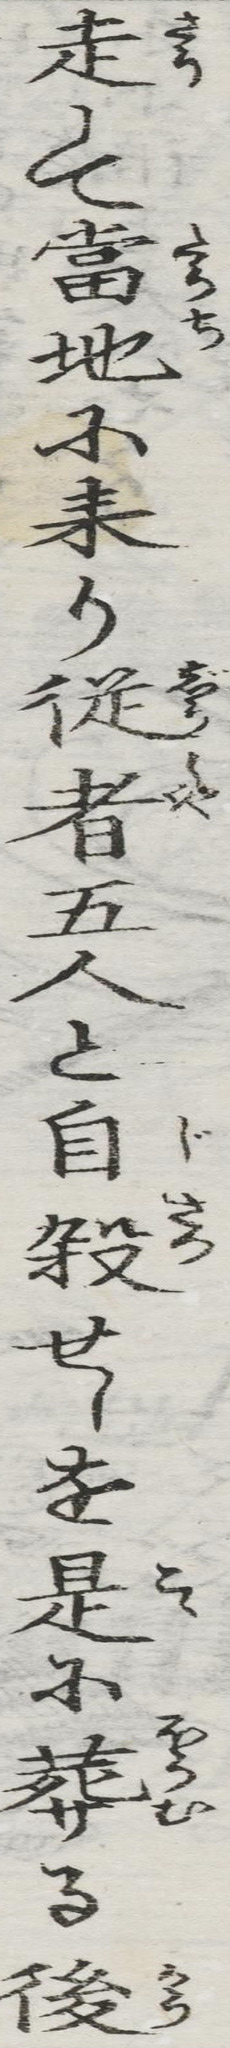走して当地に来り従者五人と自殺せしを是に葬る後
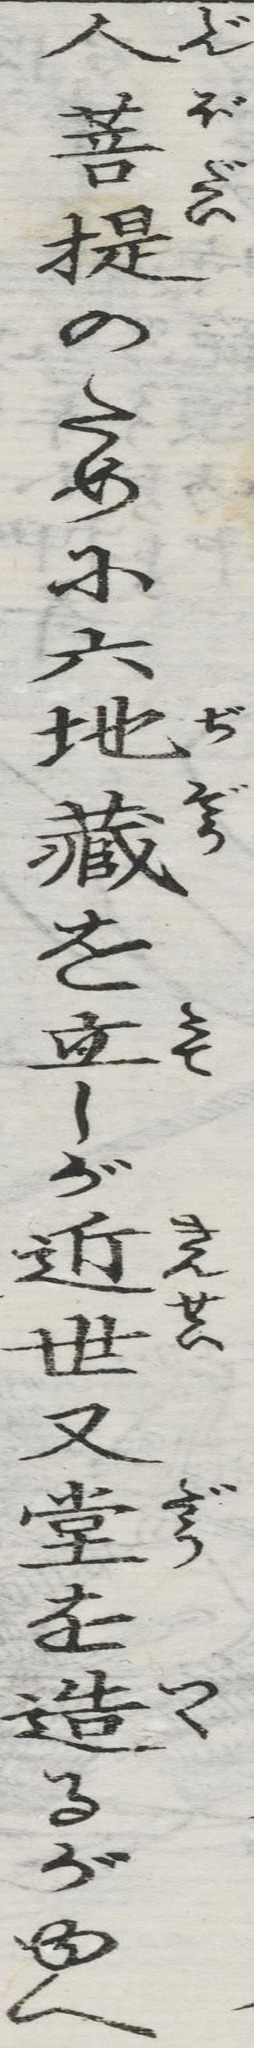人菩提のために六地蔵を立しが近世又堂を造るがゆへ
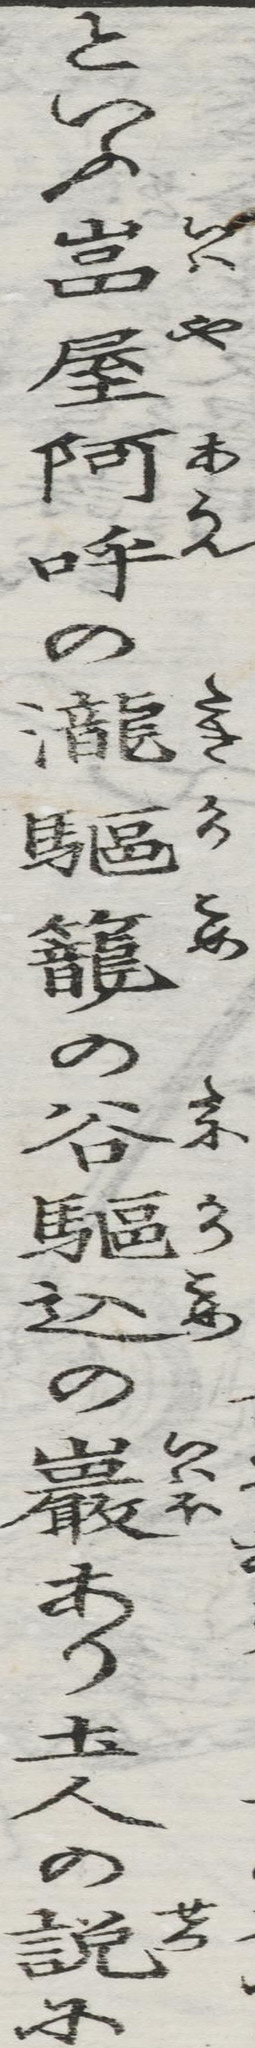といふ巌屋阿吽の滝駆籠の谷駆込の巌あり土人の説に
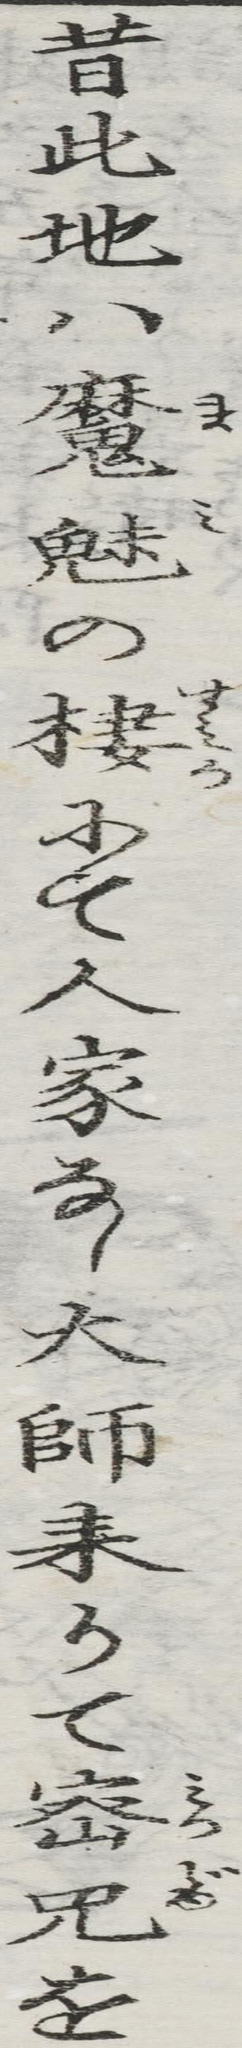昔此地は魔魅の棲にて人家なし大師来りて密呪を
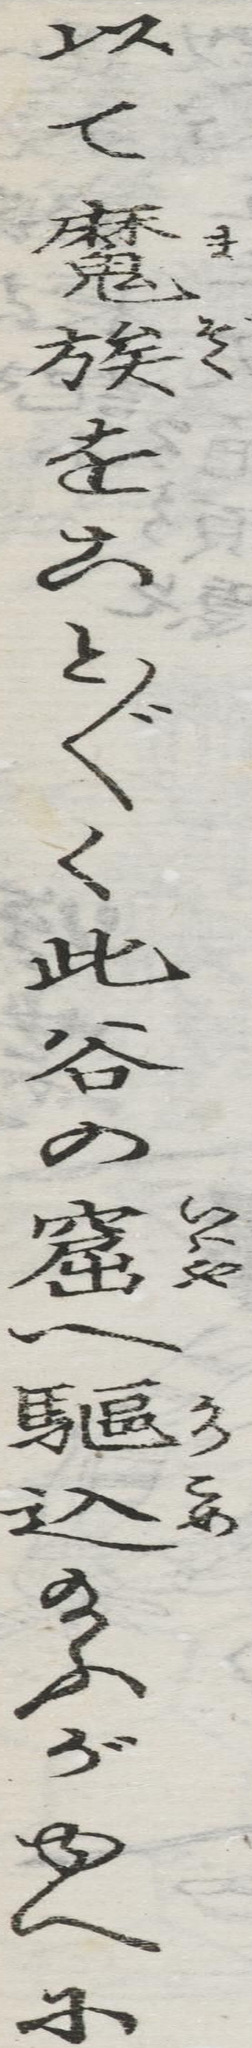以て魔族をこと〴〵く此谷の窟へ駆込給ふがゆへに

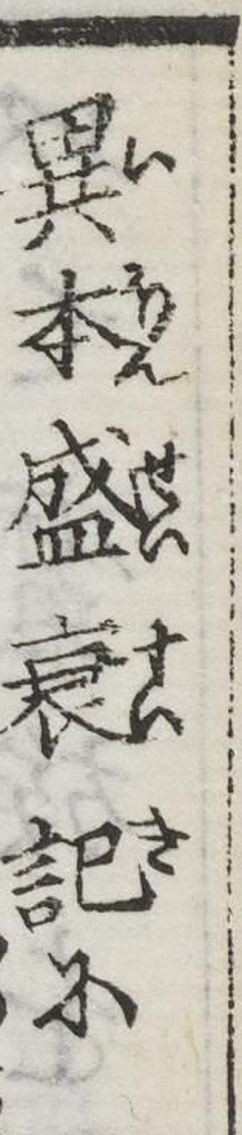異本盛衰記に
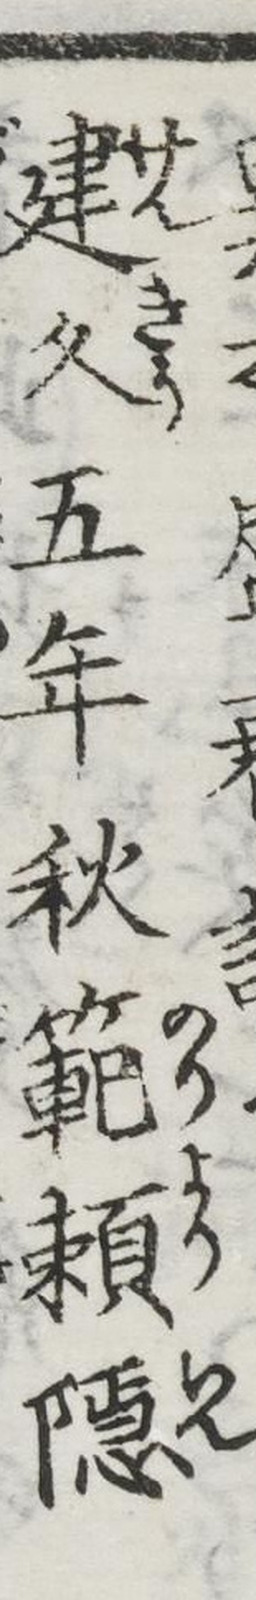建久五年秋範頼陰
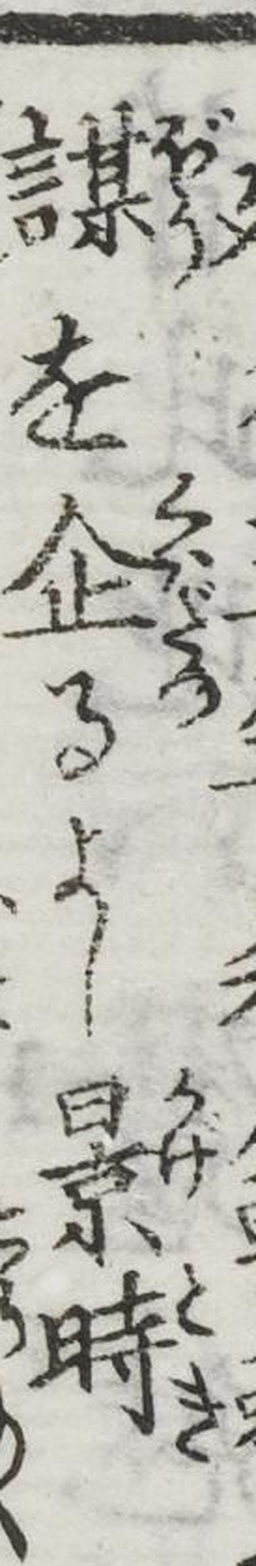謀を企るよし景時
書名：伊豆国修善寺温泉名所記　全
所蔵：東京大学地震研究所図書室 Earthquake Research Institute Library, The University of Tokyo, JAPAN
